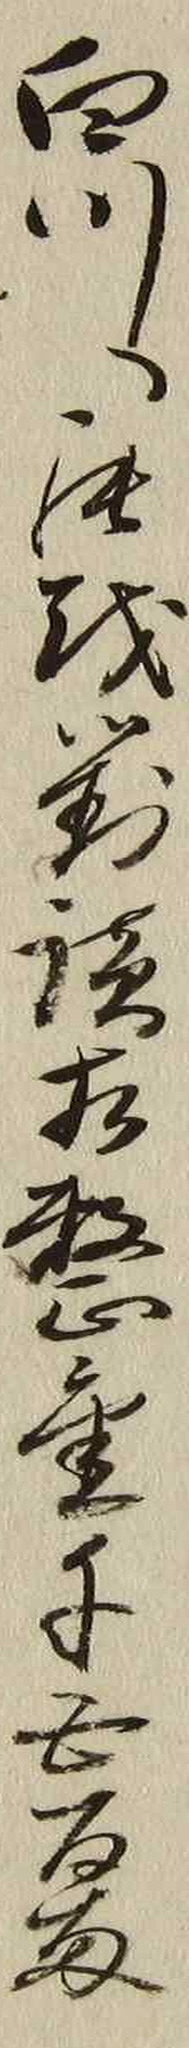白川へ罷越対談相整金千五百両
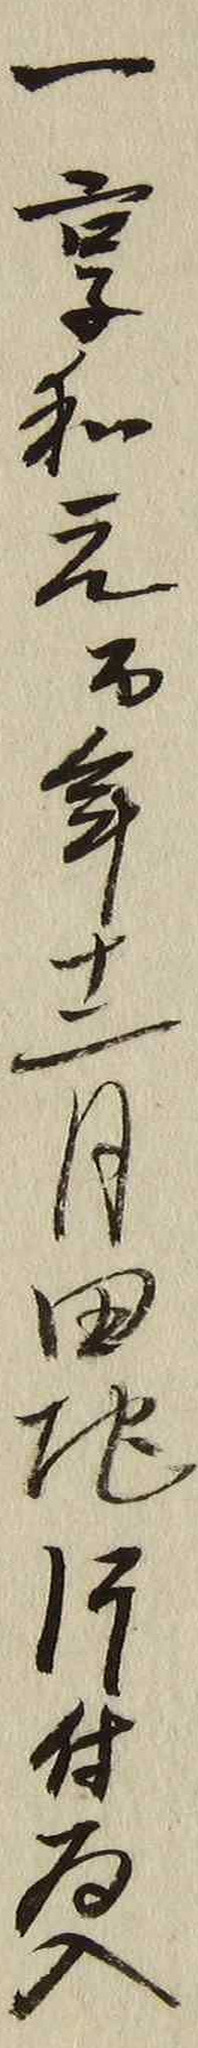一享和元酉年十二月田地片付為入
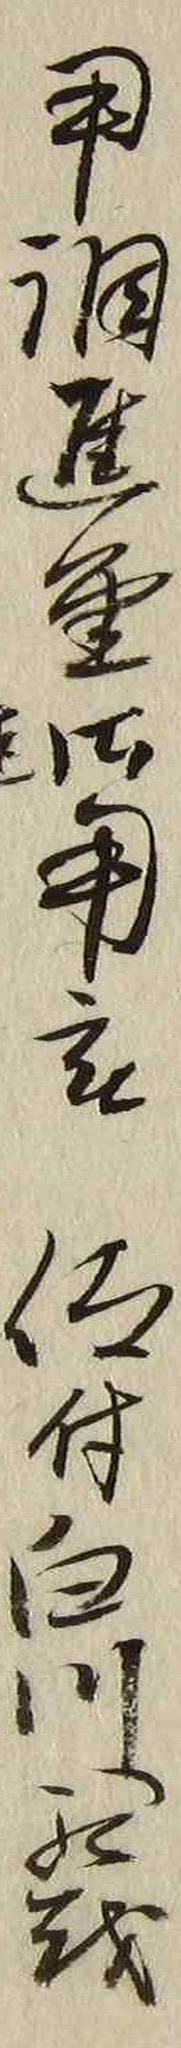用調進金御用被仰付白川へ罷越
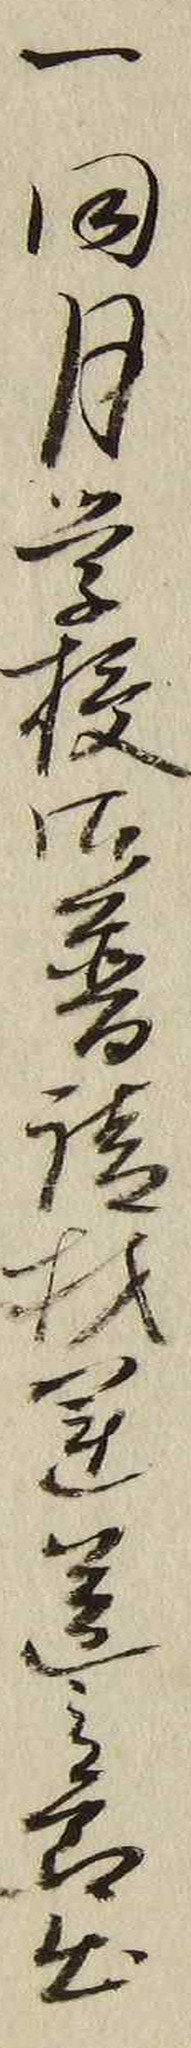一同月学校御普請材運送之節出
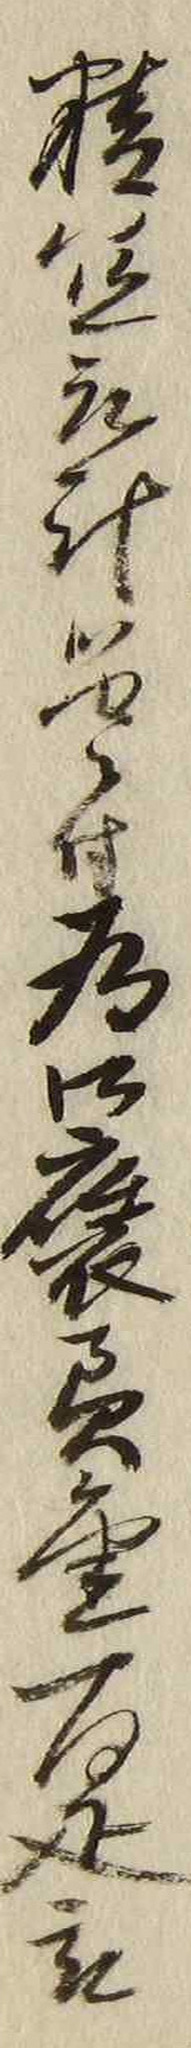精宜取計候由ニ付為御褒美金百疋被

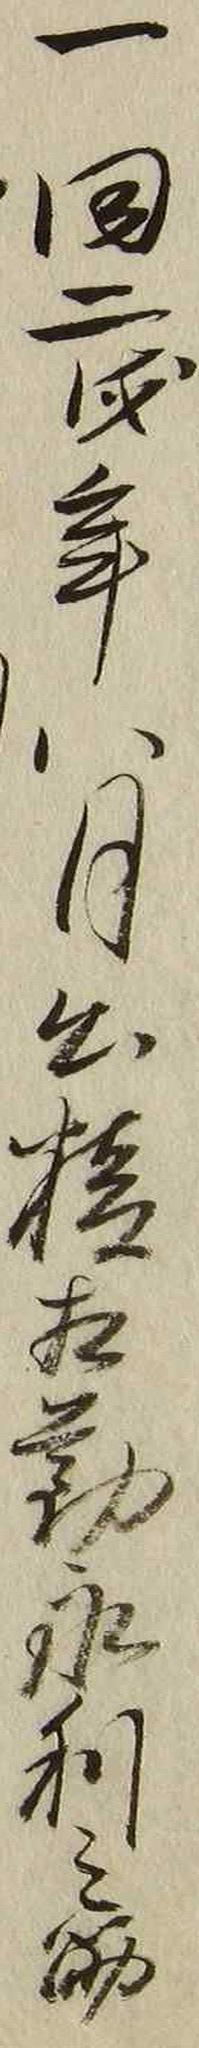一同二戌年八月出精相勤永利之筋
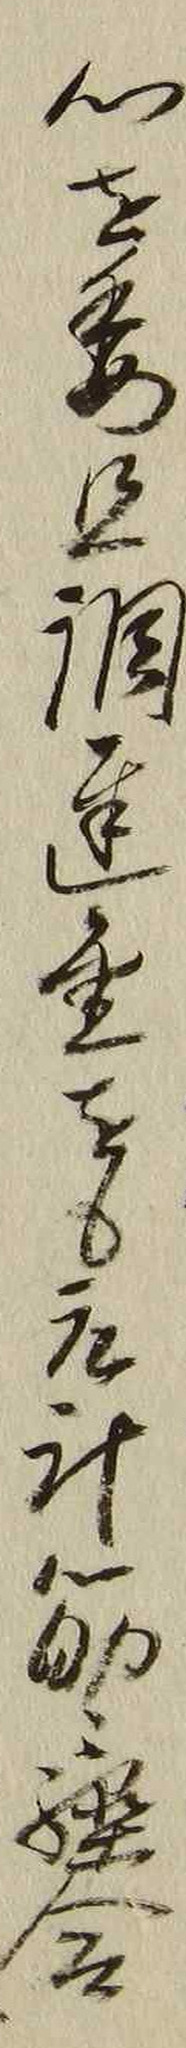心を委且調達金をも取計筋ニ繰合
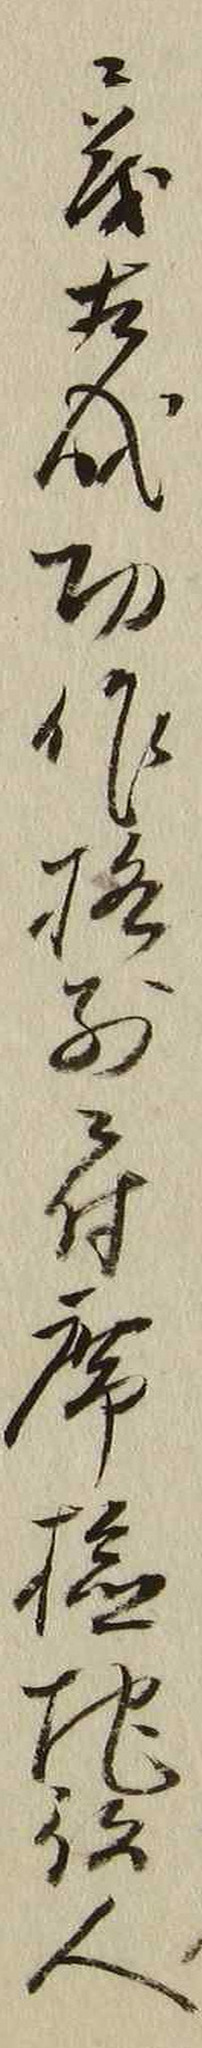ニも相成功作格別ニ付席検地役人
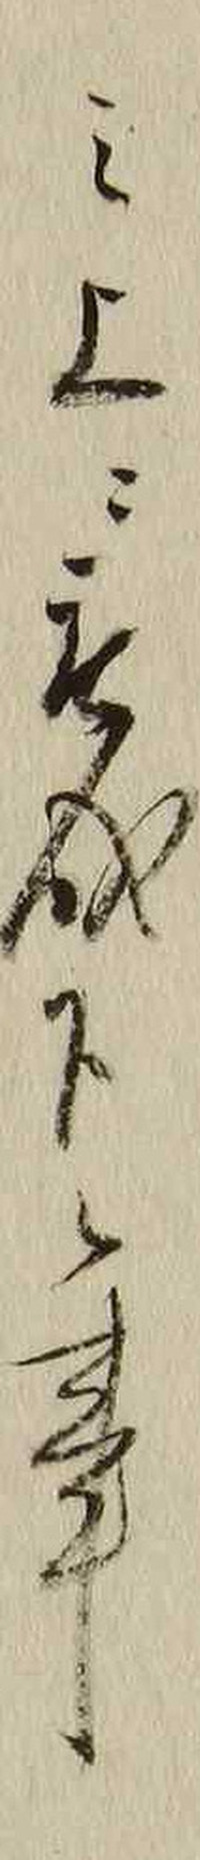之上ニ被成下候事
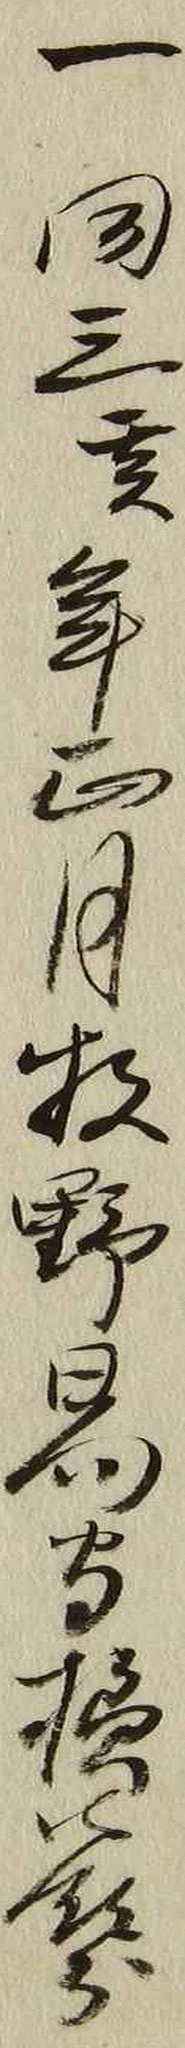一同三亥年正月牧野日向守様御領分
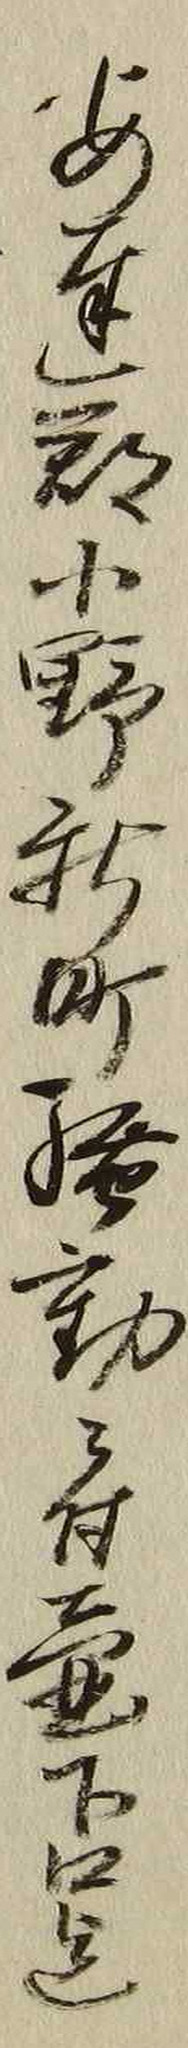安達郡小野新町騒動ニ付壷下口迄
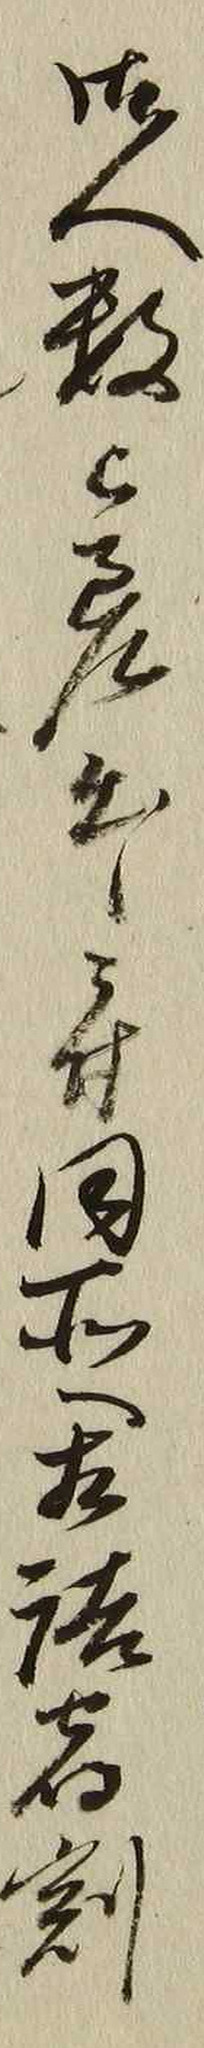御人数被差出候ニ付同所へ相詰宿割
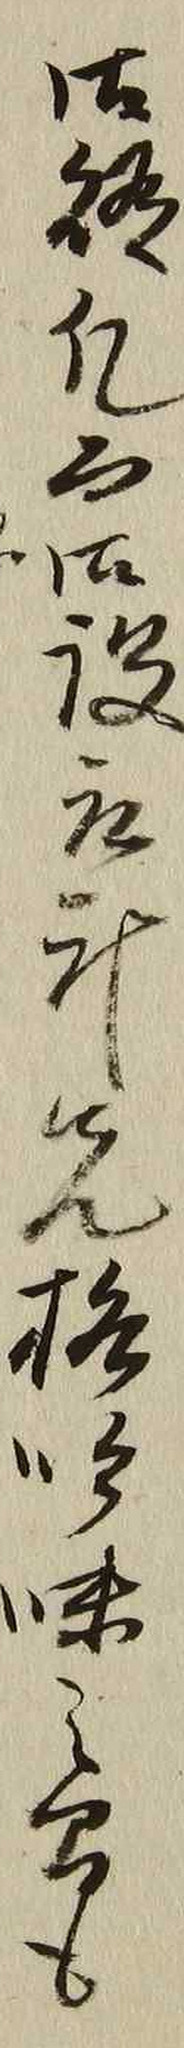御賄凡而御役取計先格吟味之間も
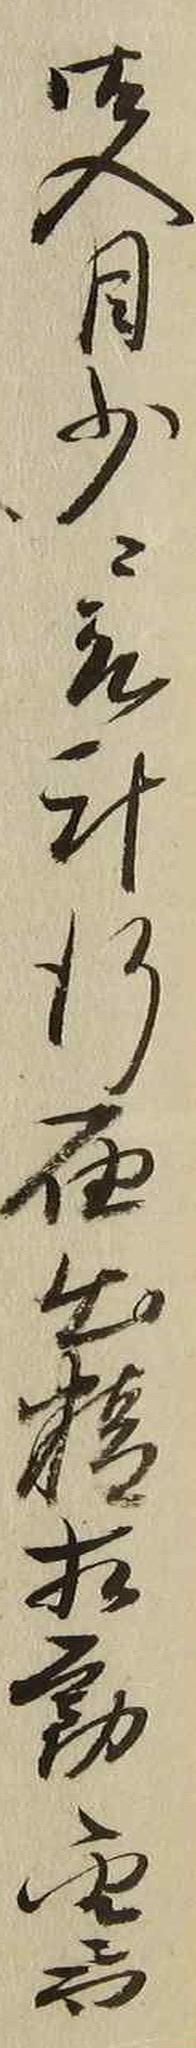御入目少ニ取計行届出精相勤候由ニ而
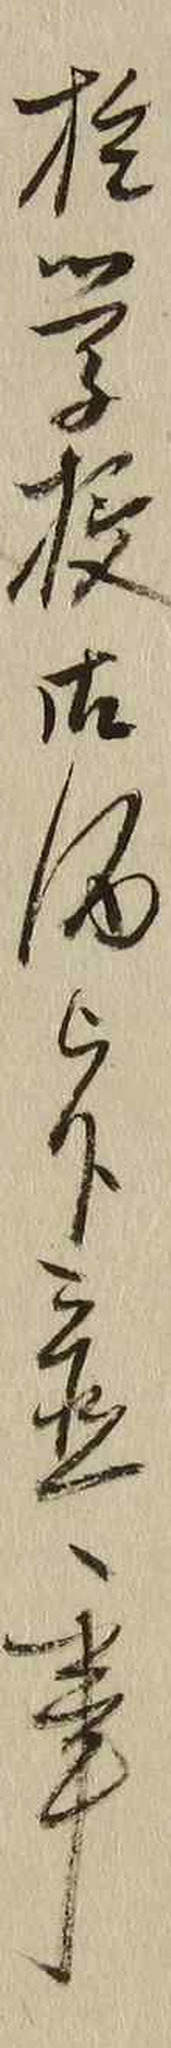於学校御酒被下置候事
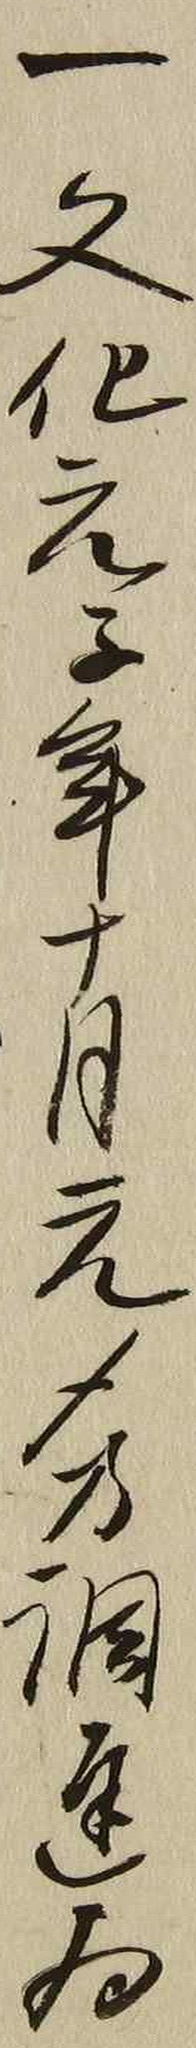一文化元子年十月元〆方調達為
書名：諸士系譜　巻之352　す之部2
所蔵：会津若松市立会津図書館
